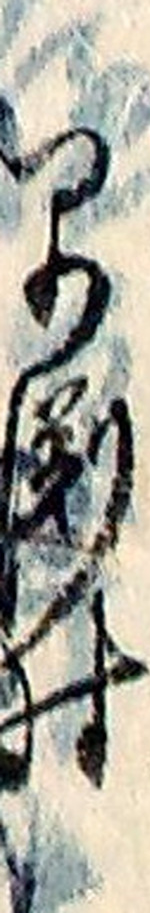早淵村
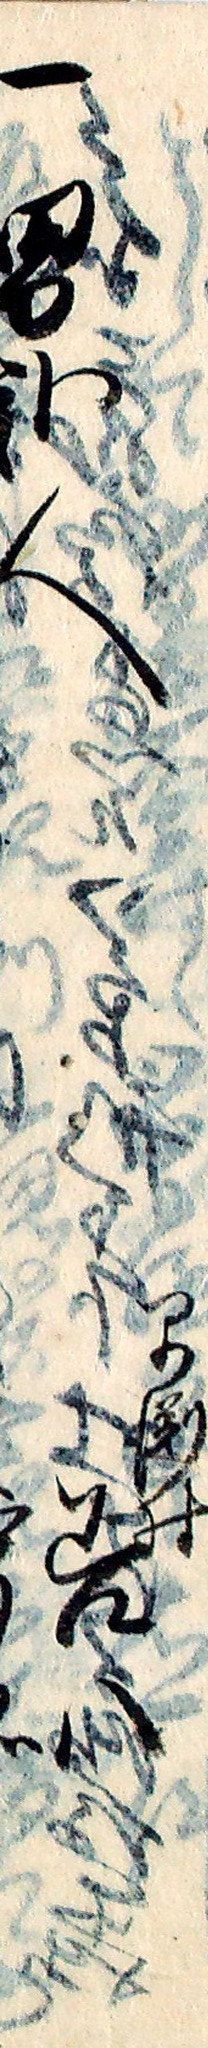一男弐人善八
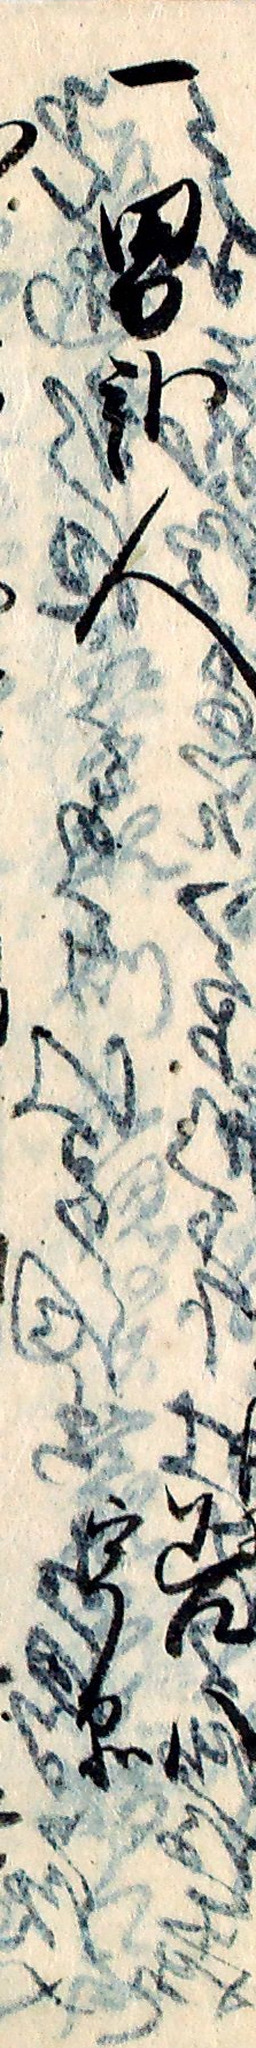一男弐人善八
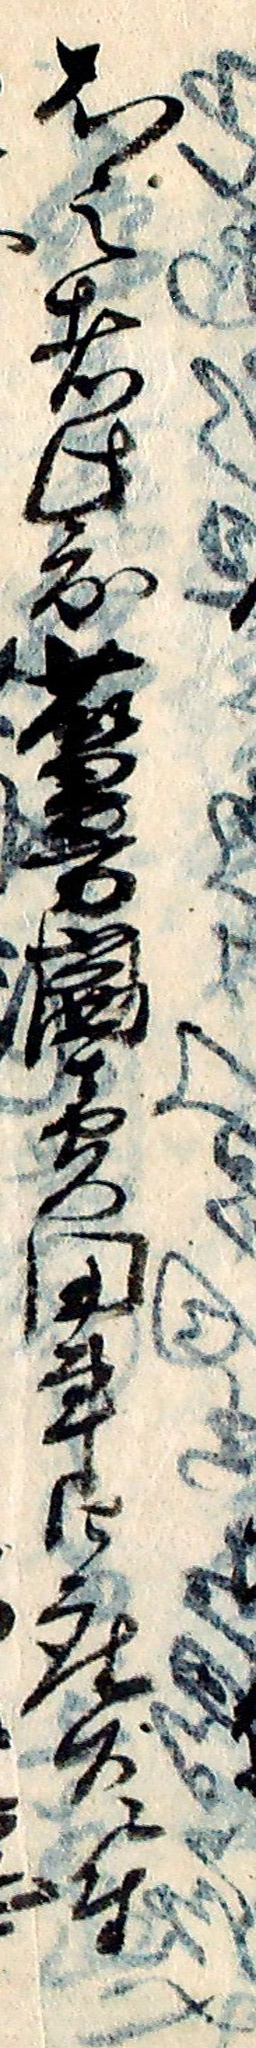右之者此度藍方商売用事御座候に付
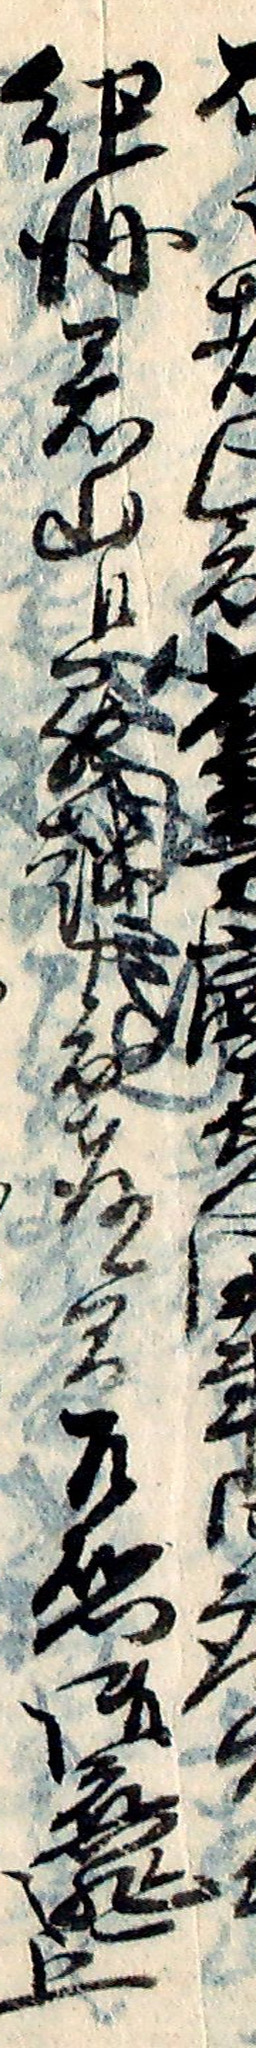紀州若山え罷越申度奉存候間乍恐御慈悲之上
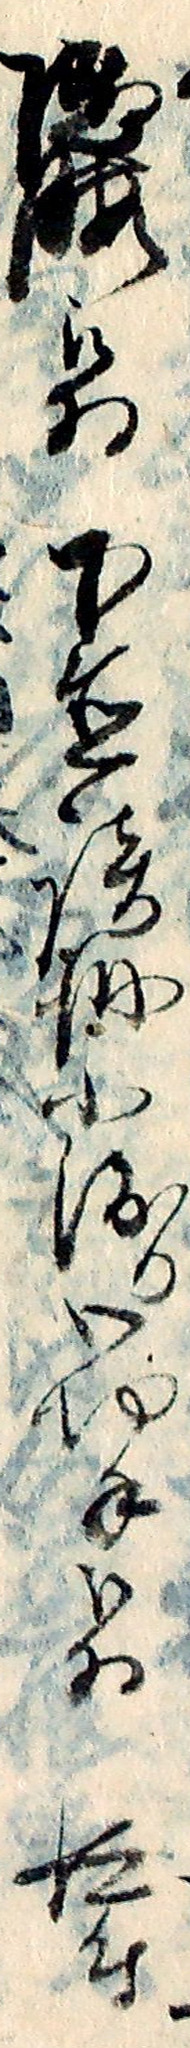御暇被為下置淡州小渡り御切手被為仰付
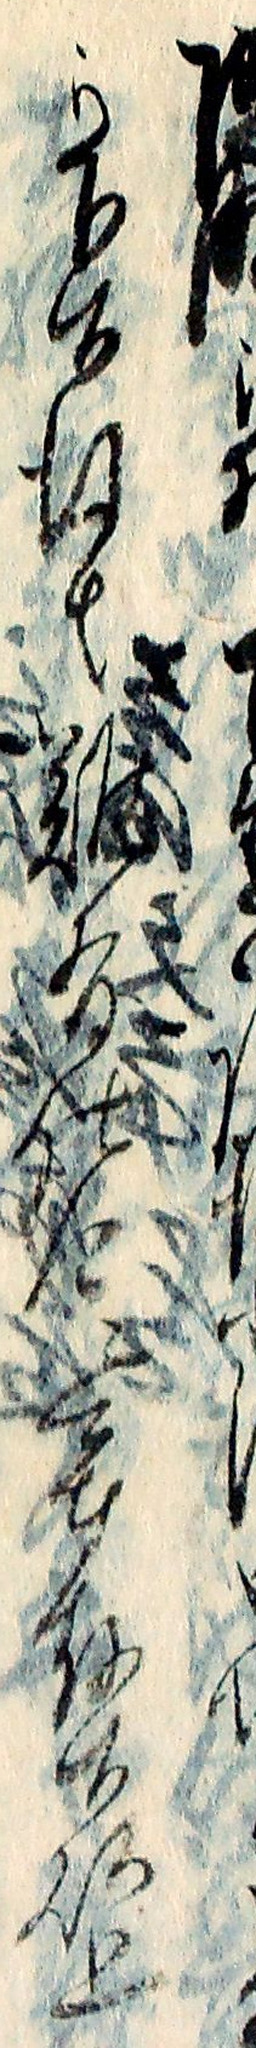被下候得は難有仕合に可奉存候以上
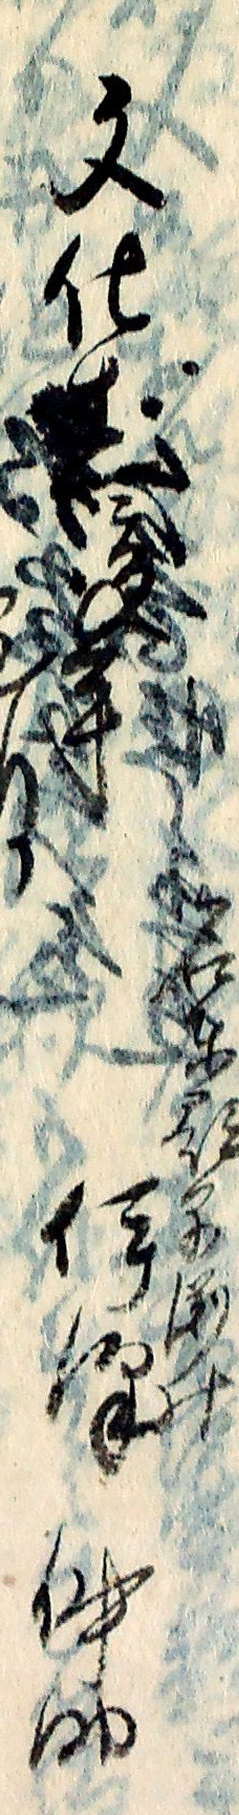文化十二亥年伊沢仲助
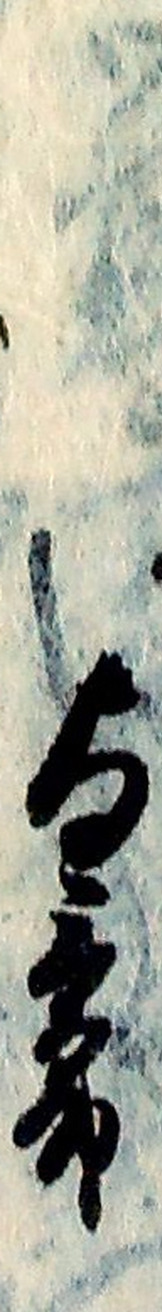与三郎
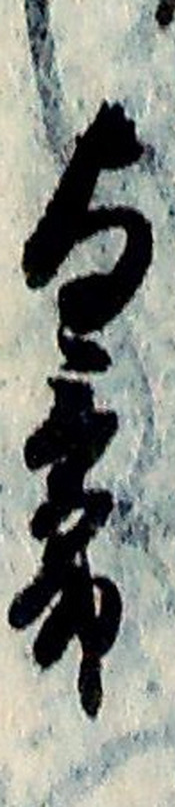与三郎
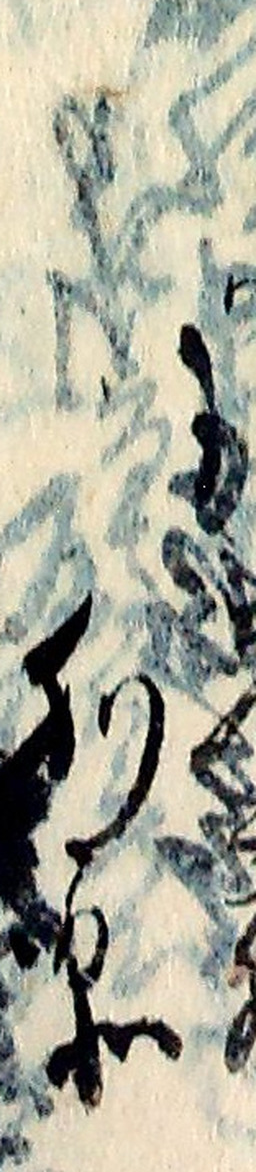利兵衛
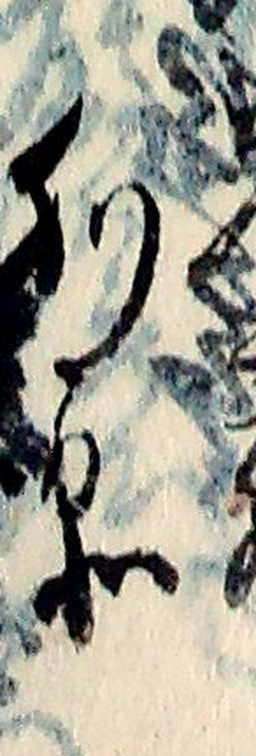利兵衛
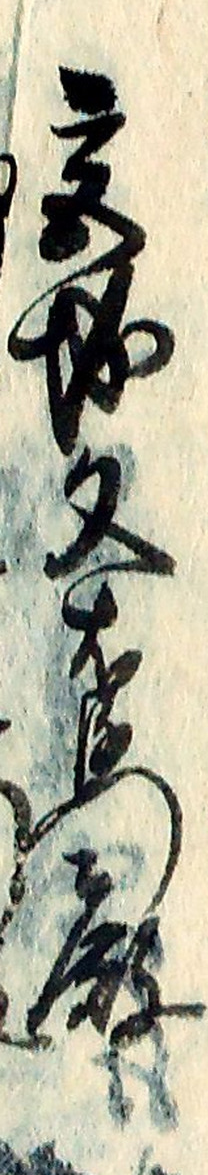宮城文右衛門殿
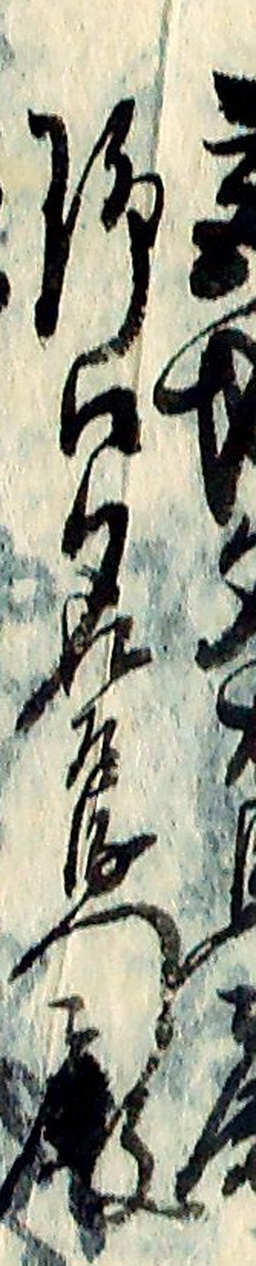野口名左衛門殿
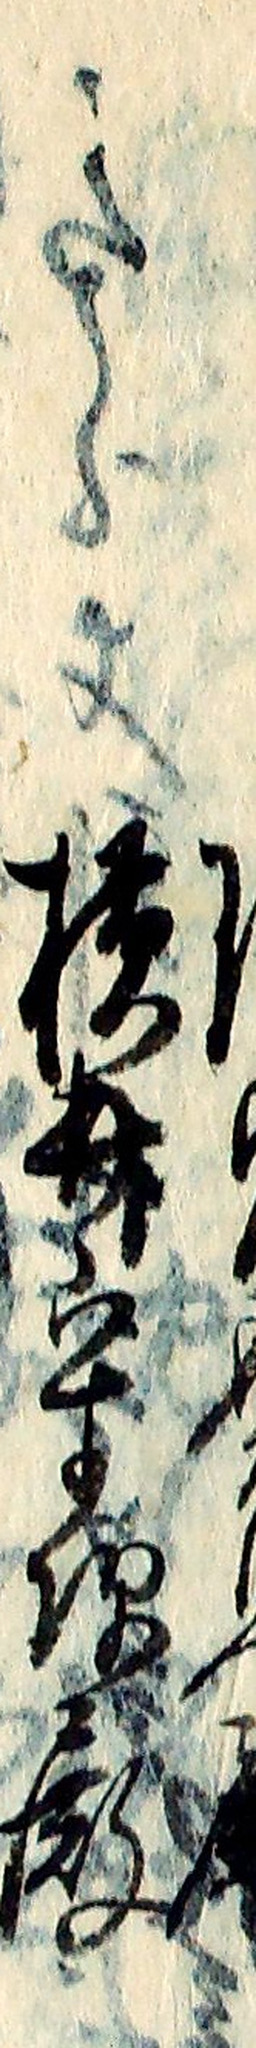横井守次殿
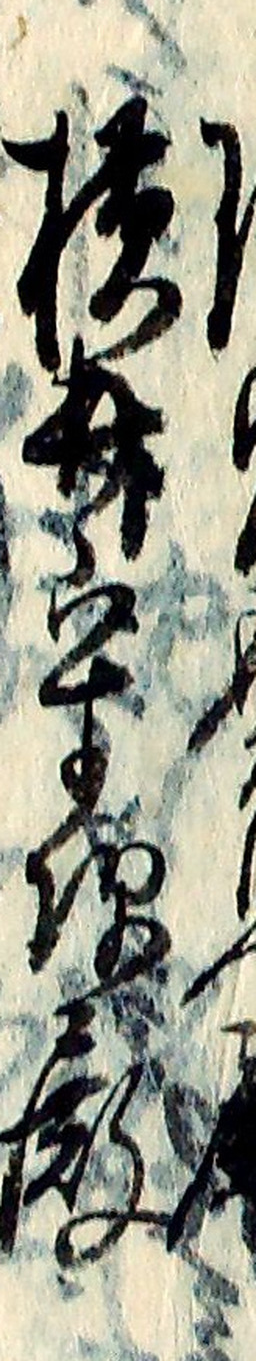横井守次殿
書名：諸御願書控(後藤氏壱番）
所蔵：鳴門教育大学 Naruto University of Education
